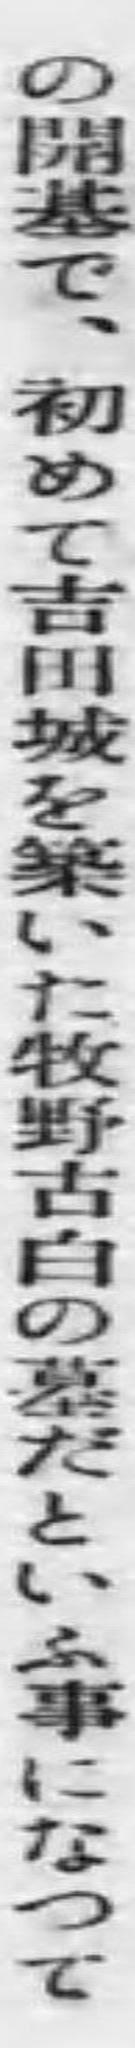の開基で、初めて吉田城を築いた牧野古白の墓だといふ事になつて
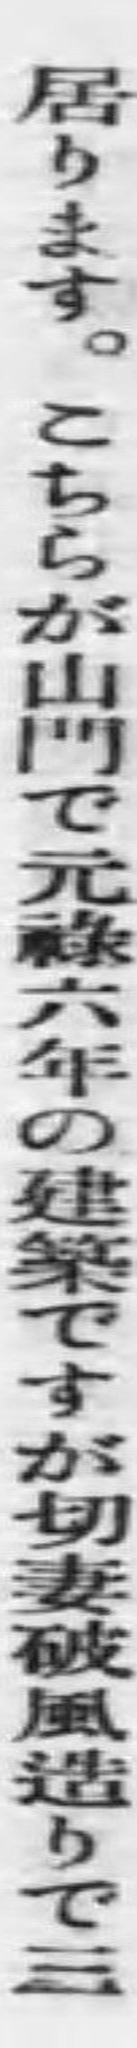居ります。こちらが山門で元禄六年の建築ですが切妻破風造りで三

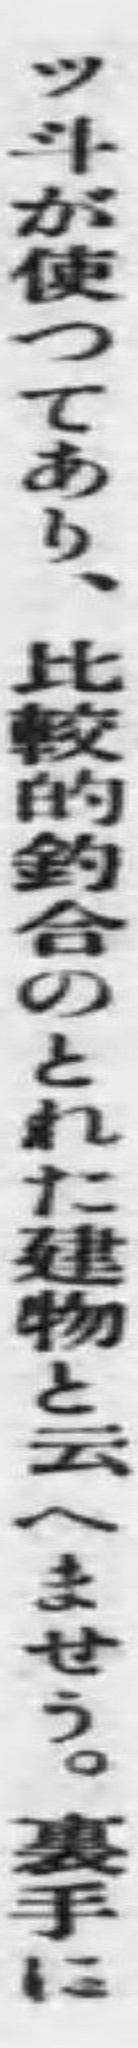ツ斗が使つてあり、比較的釣合のとれた建物と云へませう。裏手に
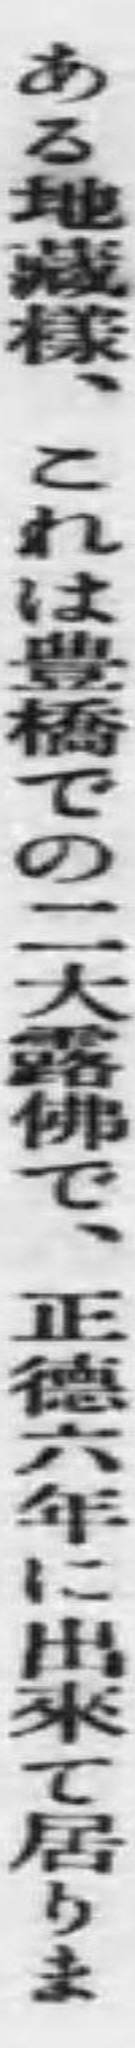ある地蔵様、これは豊橋での二大露仏で、正徳六年に出来て居りま
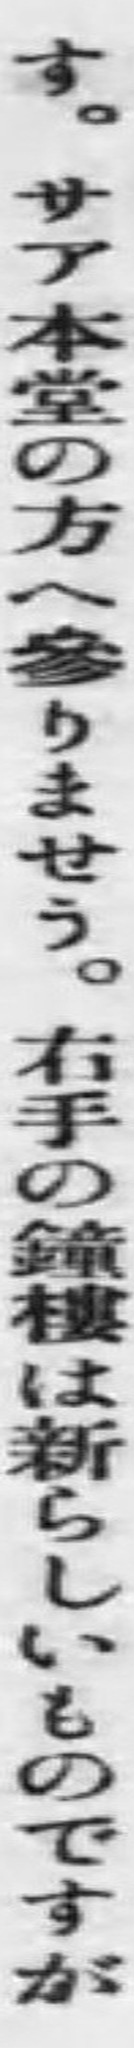す。サア本堂の方へ参りませう。右手の鐘楼は新らしいものですが
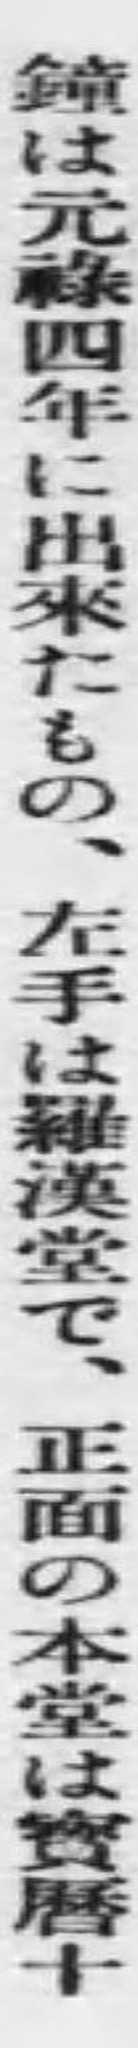鐘は元禄四年に出来たもの、左手は羅漢堂で、正面の本堂は宝暦十
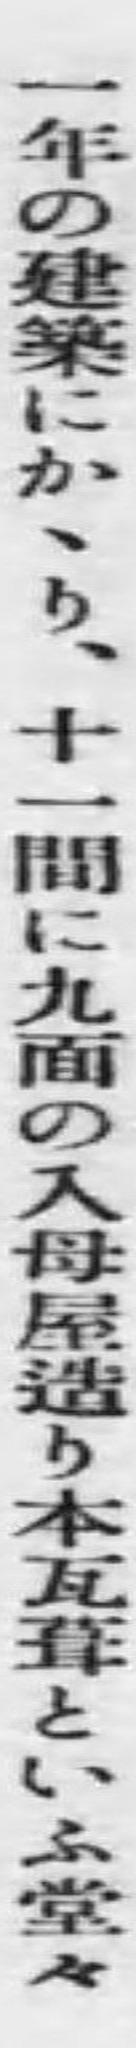一年の建築にかゝり、十一間に九面の入母屋造り本瓦葺といふ堂々
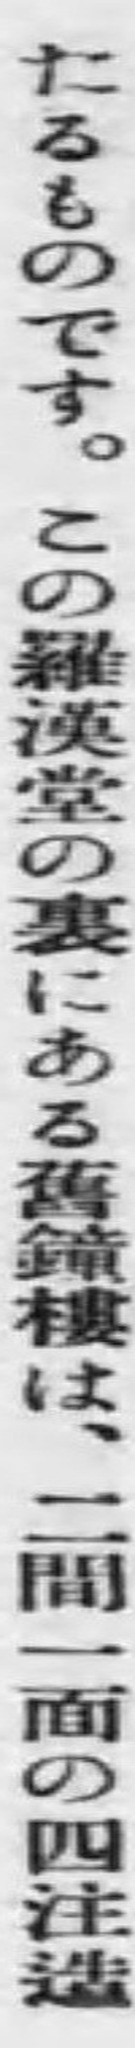たるものです。この羅漢堂の裏にある旧鐘楼は、二間一面の四注造
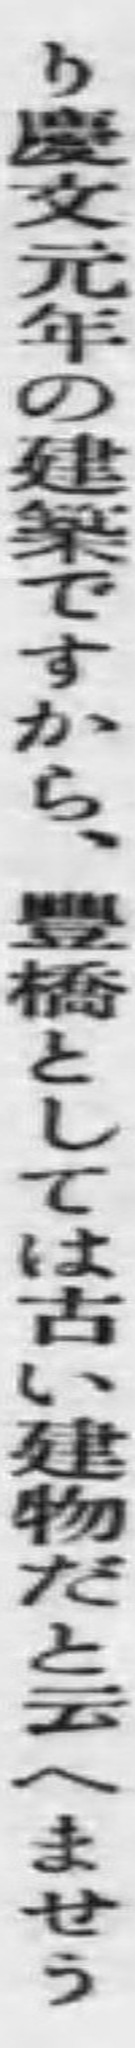り慶文元年の建築ですから、豊橋としては古い建物だと云へませう
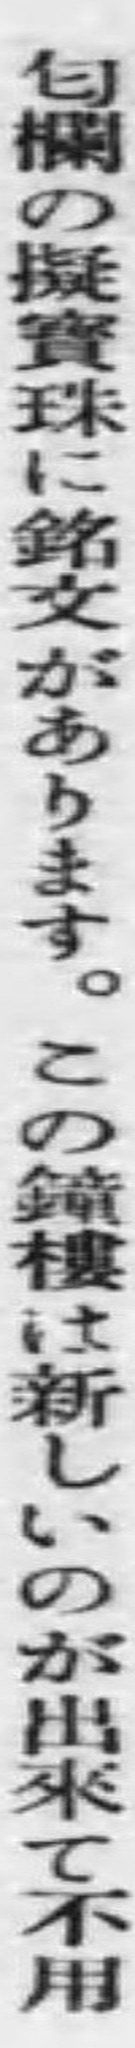匂欄の擬宝珠に銘文があります。この鐘楼は新しいのが出来て不用
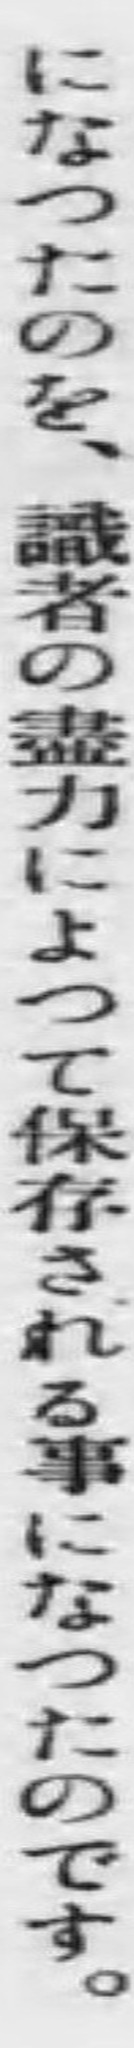になつたのを、識者の尽力によつて保存される事になつたのです。
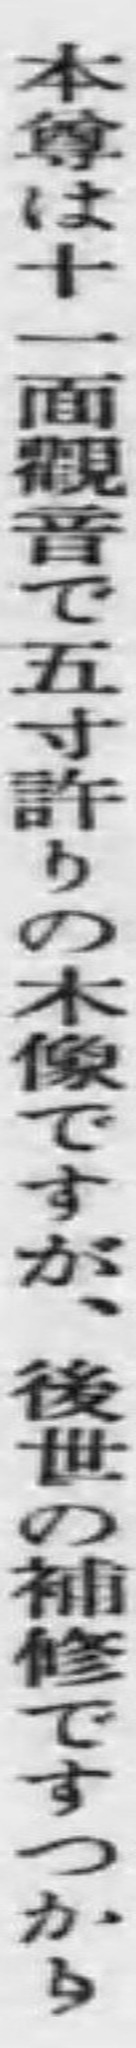本尊は十一面観音で五寸許りの木像ですが、後世の補修ですつかり
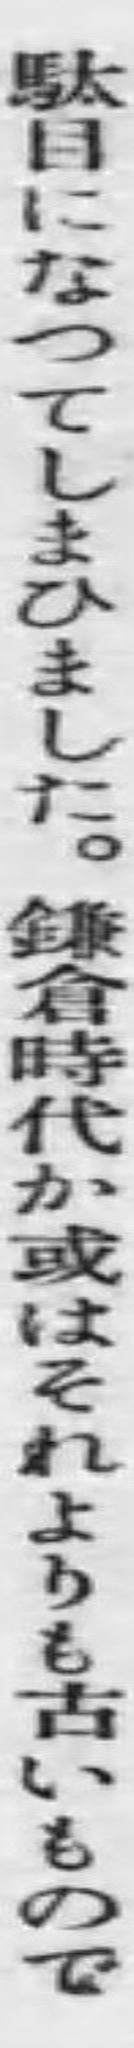駄目になつてしまひました。鎌倉時代か或はそれよりも古いもので
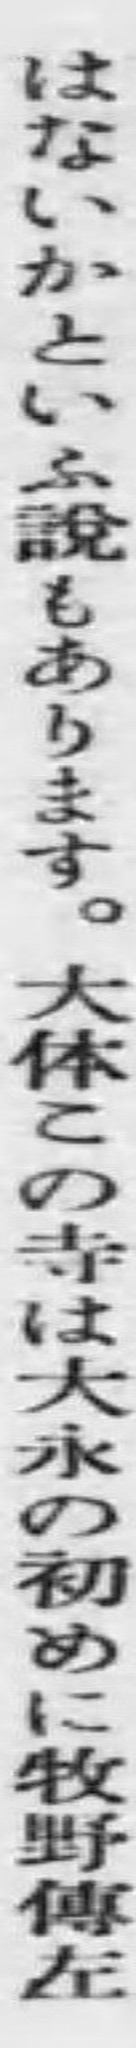はないかといふ説もあります。大体この寺は大永の初めに牧野伝左
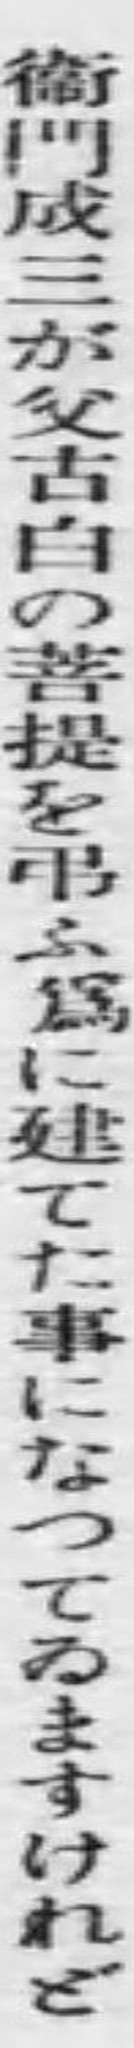衛門成三が父古白の菩提を弔ふ為に建てた事になつてゐますけれど
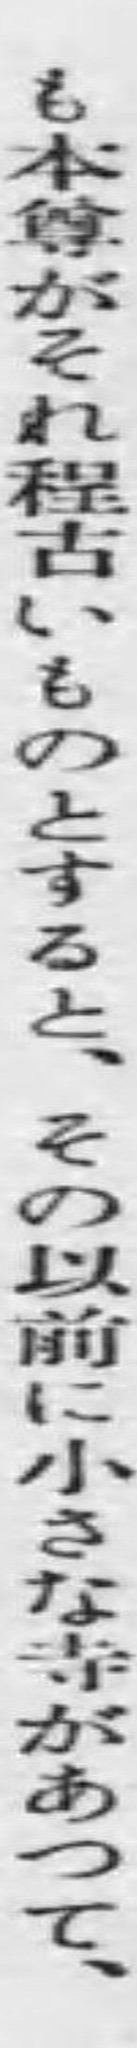も本尊がそれ程古いものとすると、その以前に小さな寺があつて、
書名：東三河道中記 : 豊橋市及其附近案内
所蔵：国立国会図書館 National Diet Library, JAPAN
